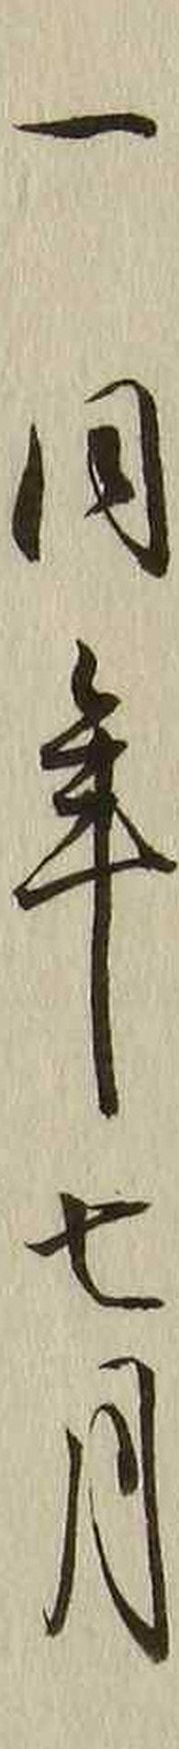一同年七月
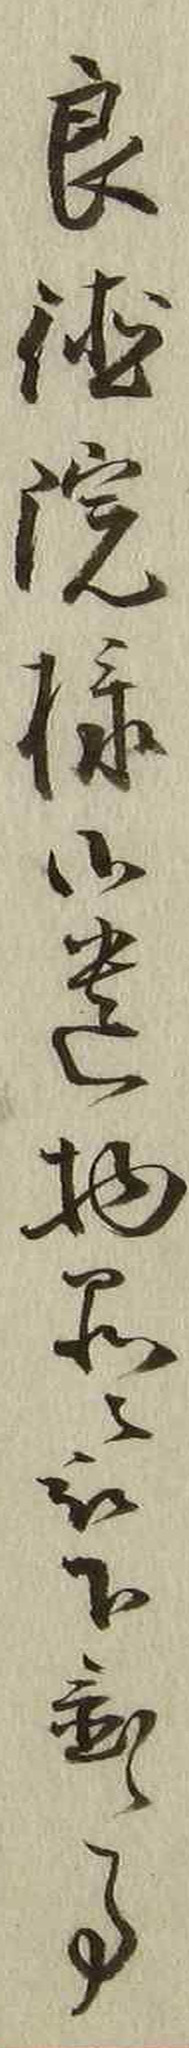良徳院様御遺物品々被下置候事
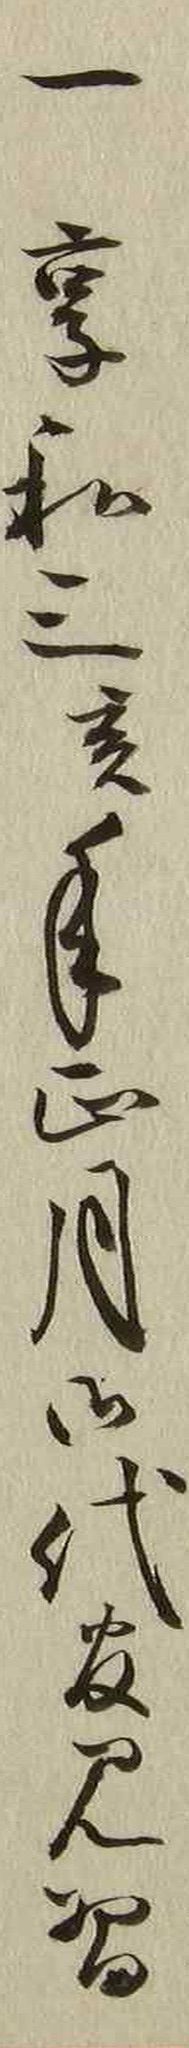一享和三亥年正月御代官見習
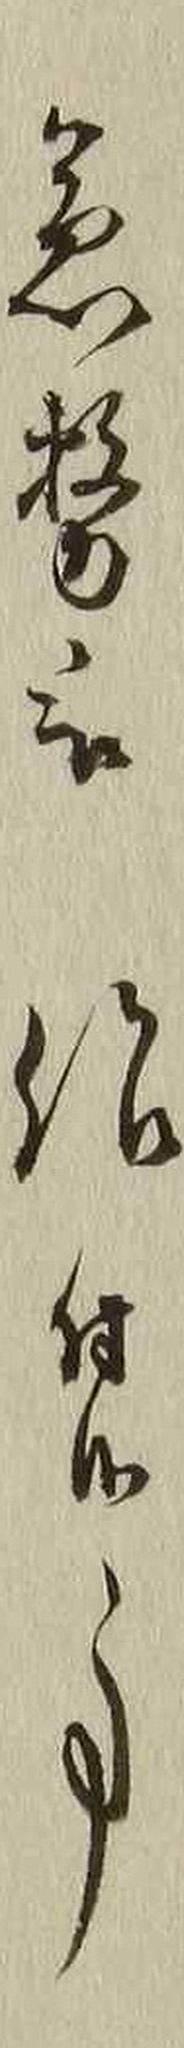兼務被仰付候事
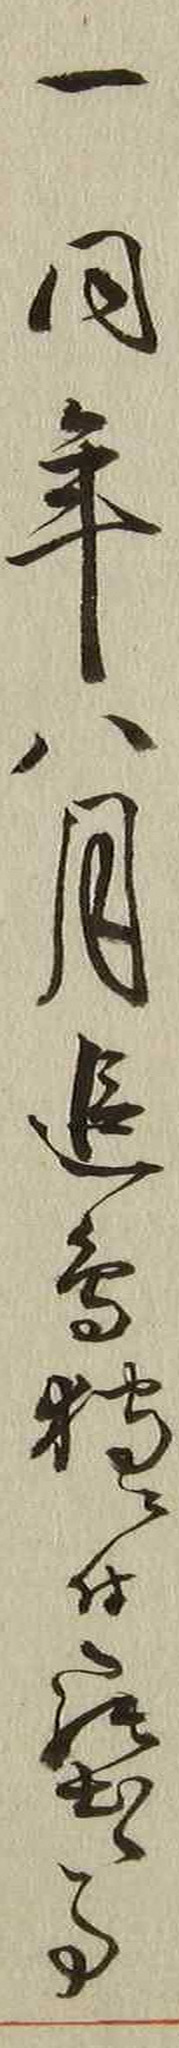一同年八月追鳥狩ニ付罷出候事
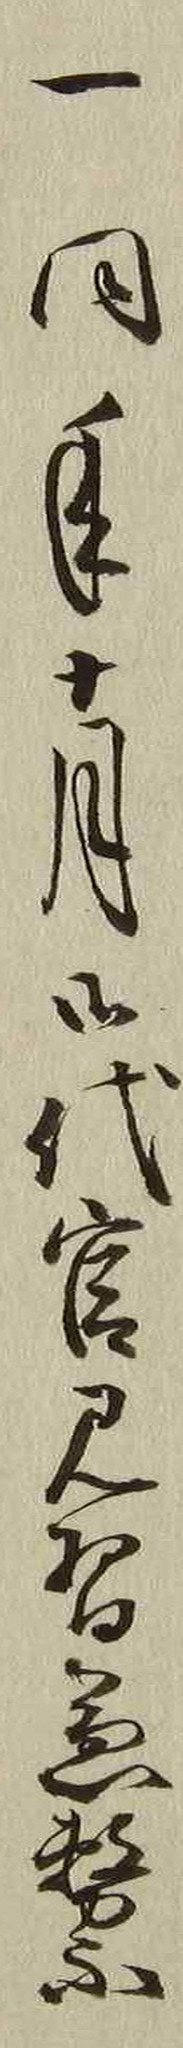一同年十月御代官見習兼務不
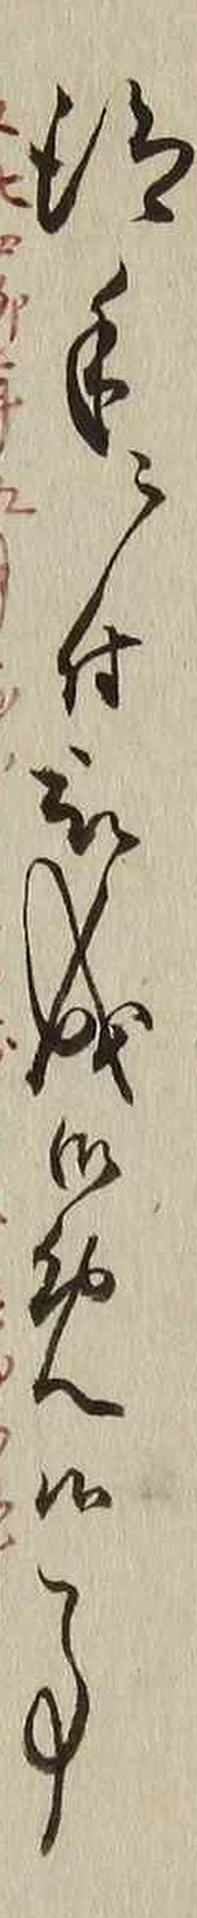得手ニ付被成御免候事
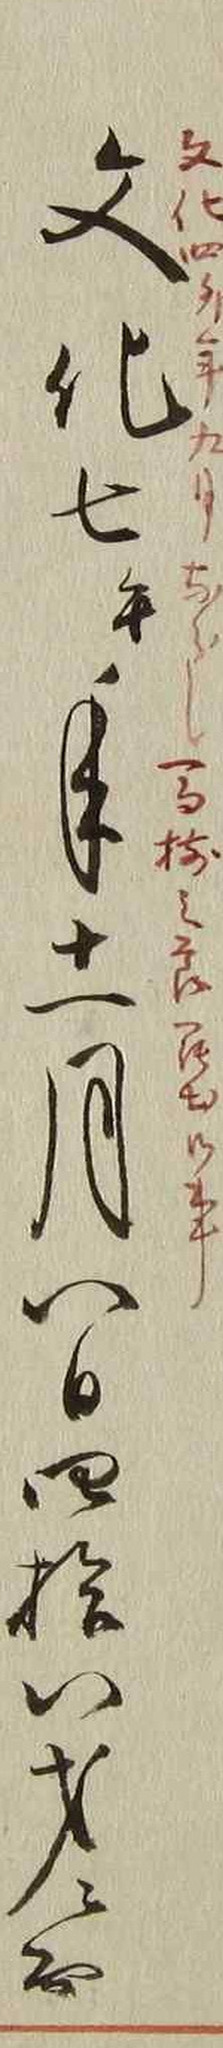一文化七午年十一月八日四拾八才ニ而
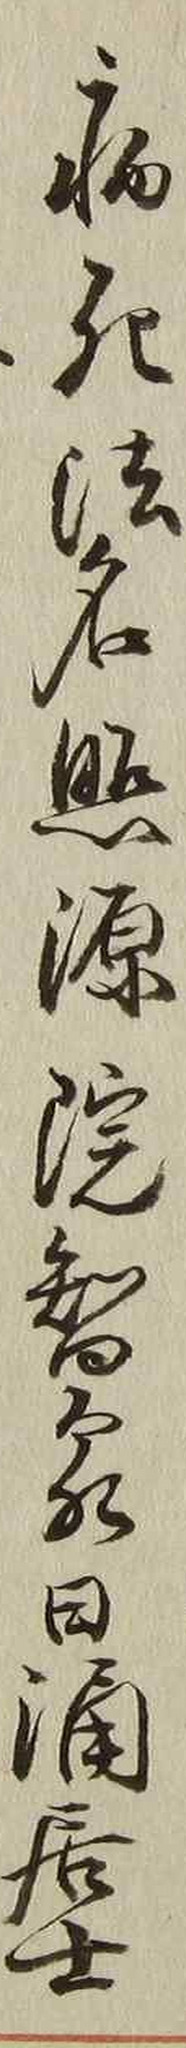病死法名照源院智泉日涌居士
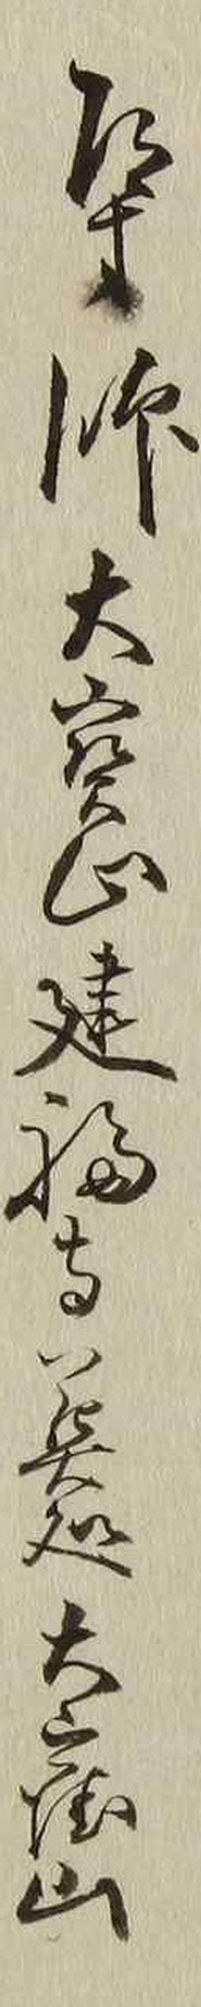導師大宝山建福寺葬処大窪山
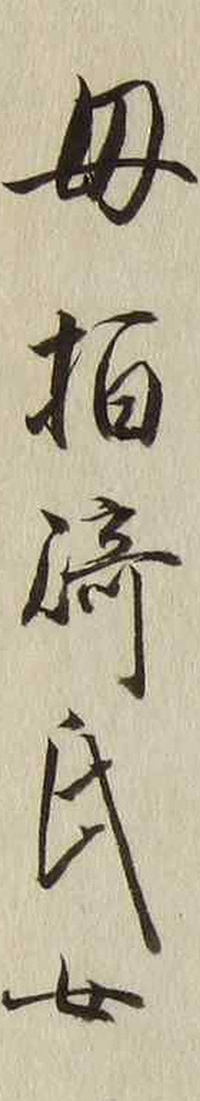母柏崎氏女
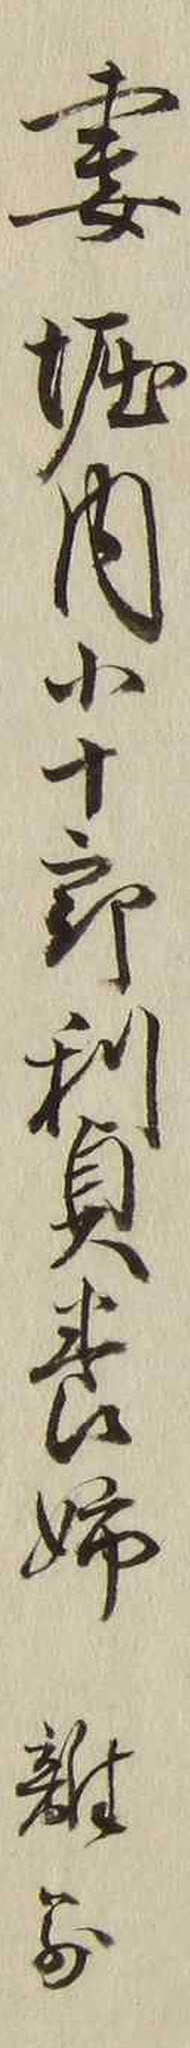妻堀内小十郎利貞養姉離別

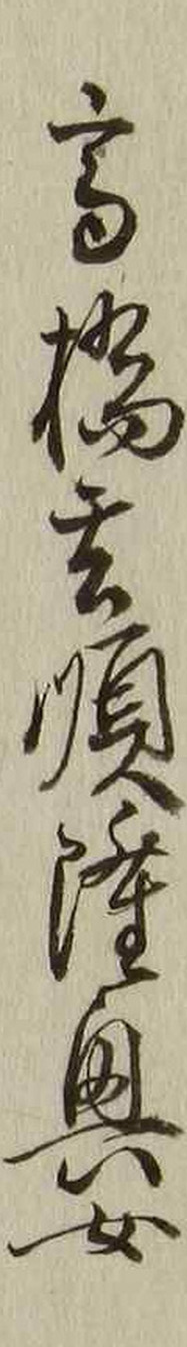高橋玄順降興女
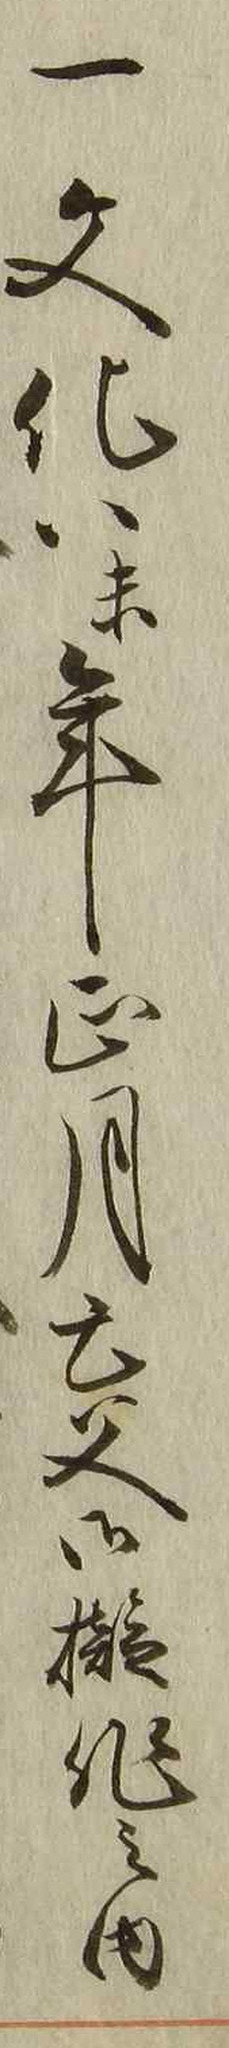一文化八未年正月亡父御擬作之内
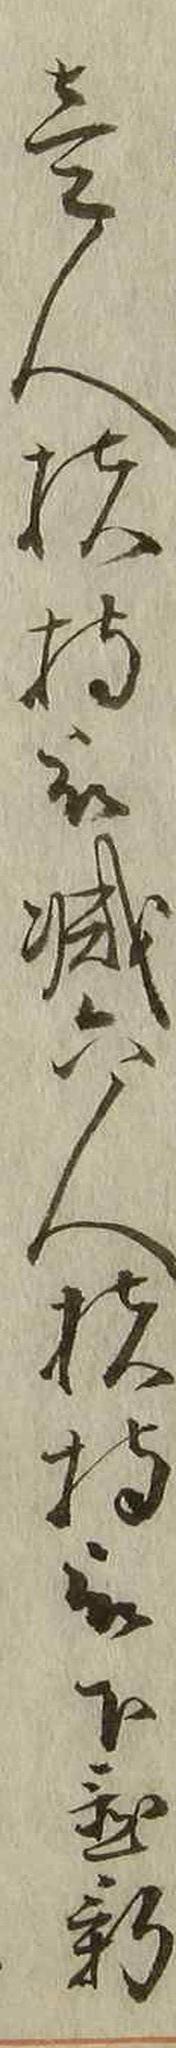壱人扶持被減六人扶持被下置新
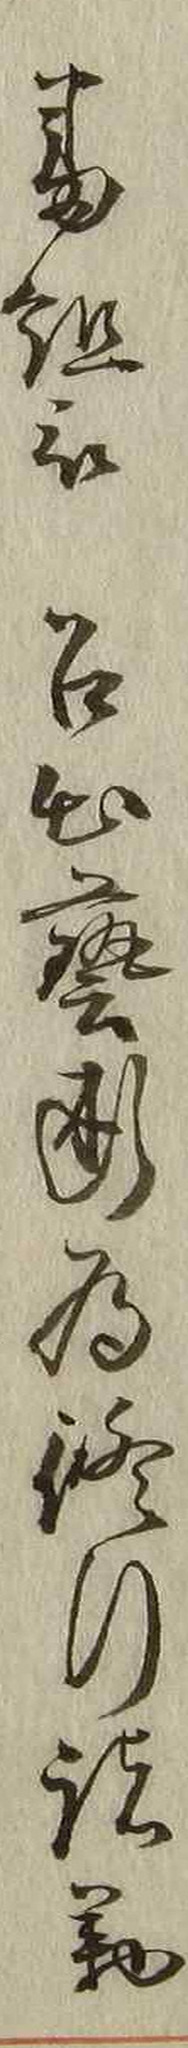番組被召出芸術為修行諸勤
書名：諸士系譜　巻之57　ほ之部4
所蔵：会津若松市立会津図書館
